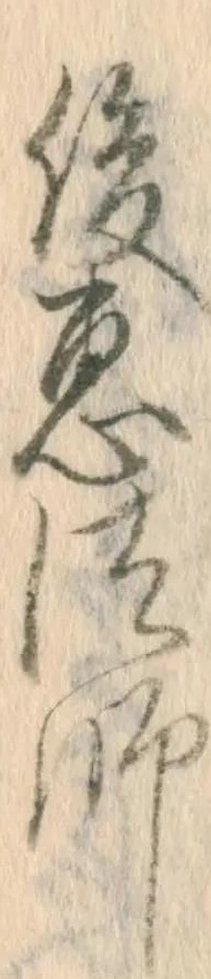俊恵法師
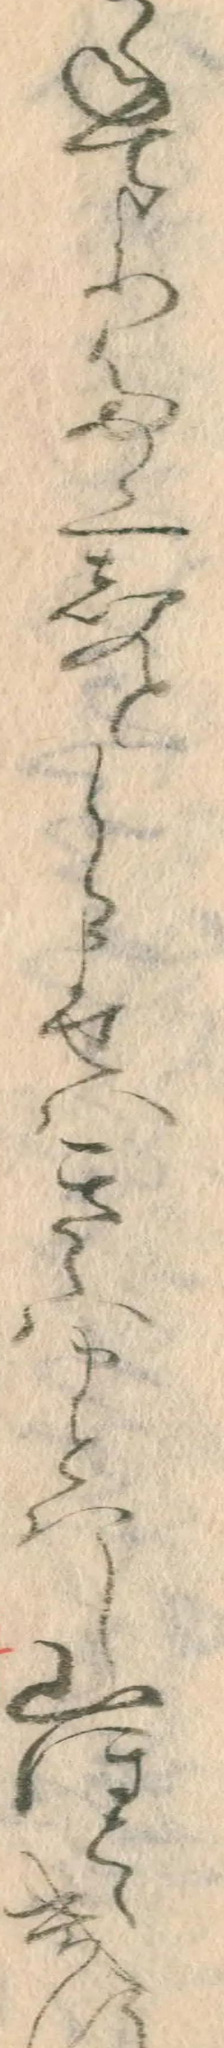かねてよりたゝ一声としらませはきゝはまとはし山ほとゝきす
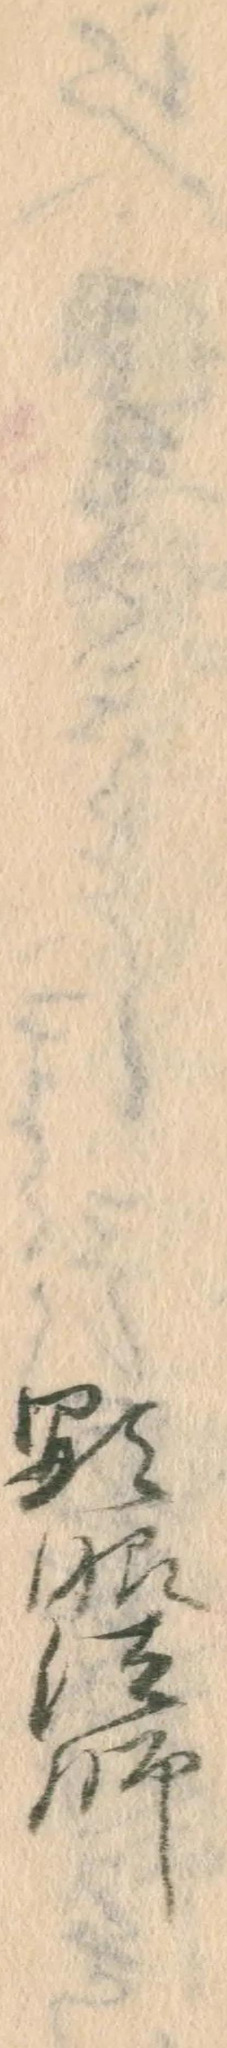顕昭法師
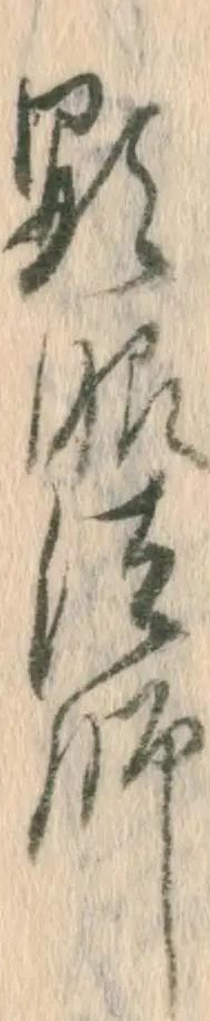顕昭法師
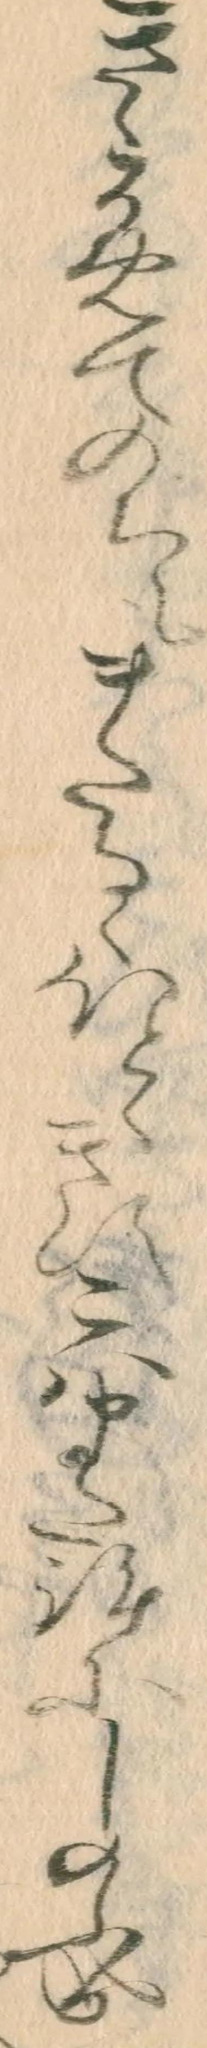きゝそめてのちもまたるゝほとゝきすこはまた誰にしのふ成らん
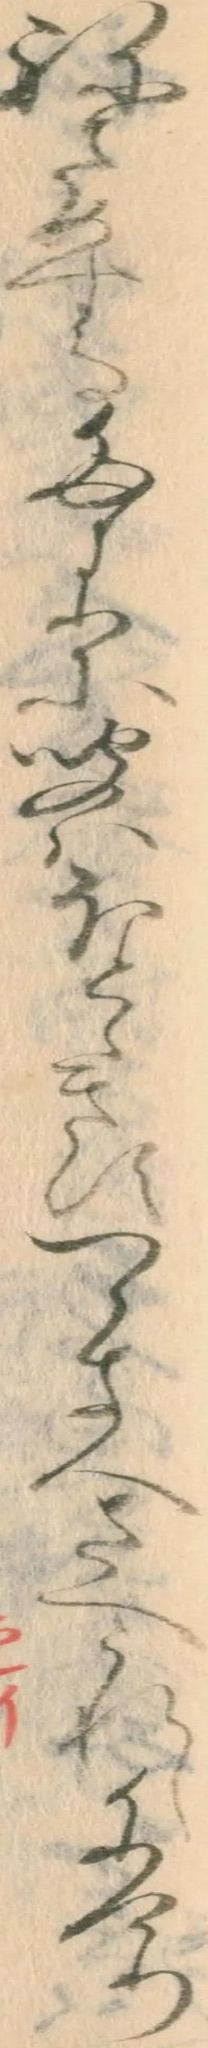ねさめするたよりに聞はほとゝきすつらき人さへうれしかりけり
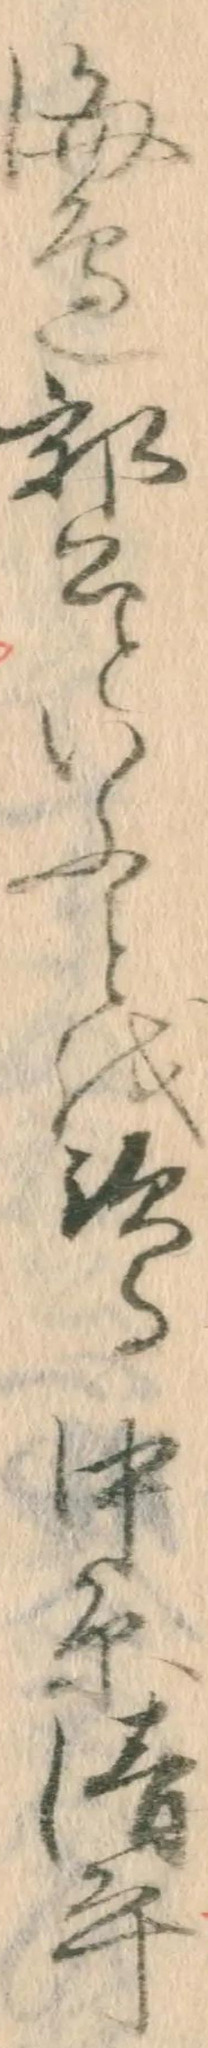海辺郭公といふことを読る中原清平
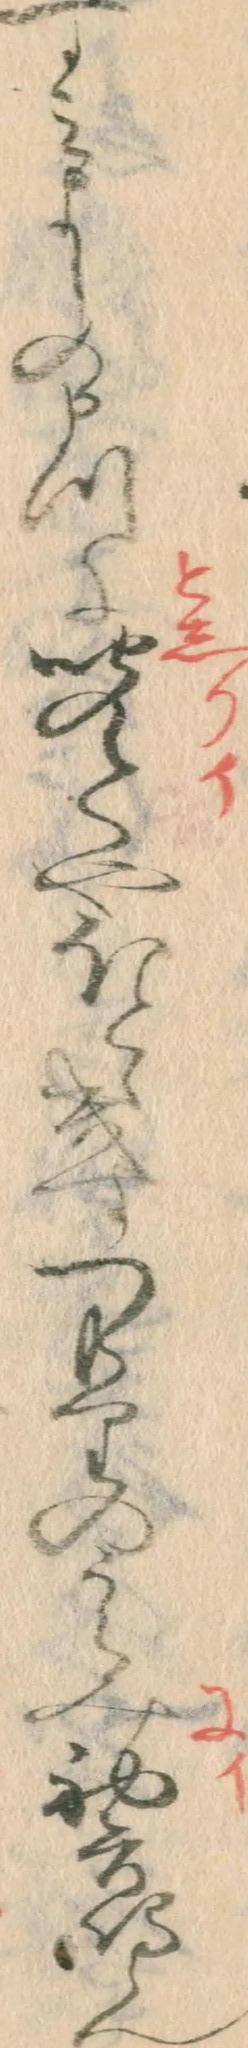すみよしのまつに聞てやほとゝきすつもりのうらみ初音鳴らん
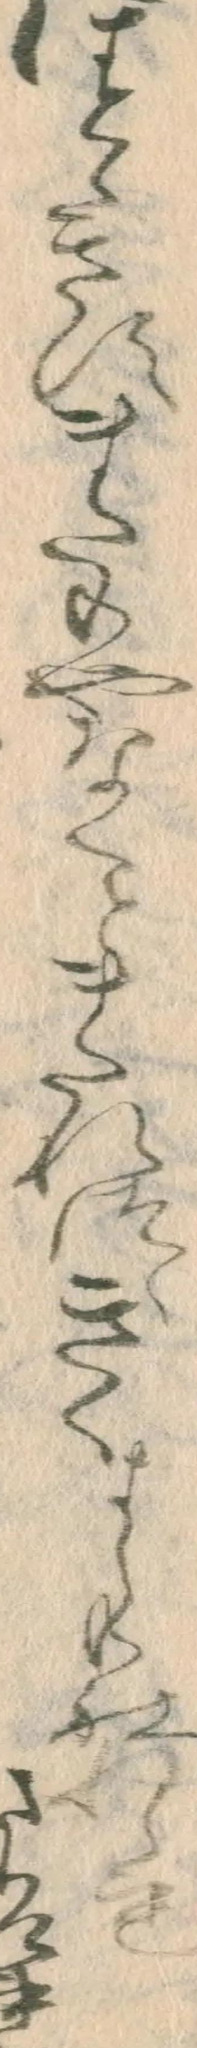ほとゝきすまたもやなくとまたれつゝきくよしも社ねられさりけれ
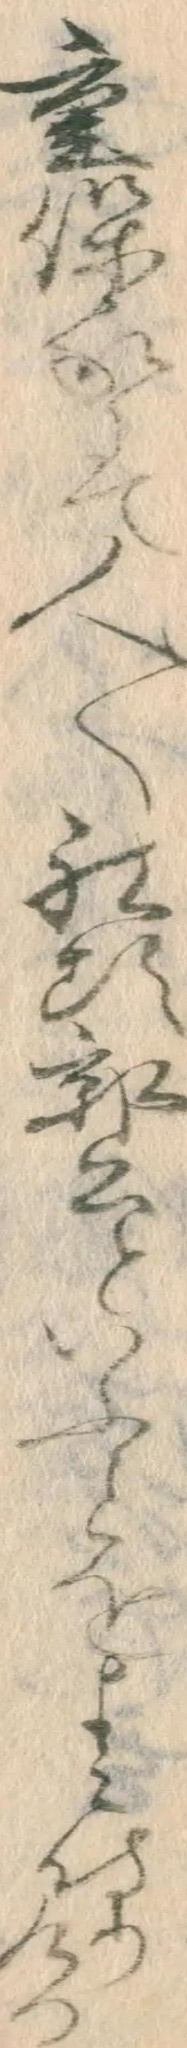重保家にて人〳〵社頭郭公といふことをよみ侍りける
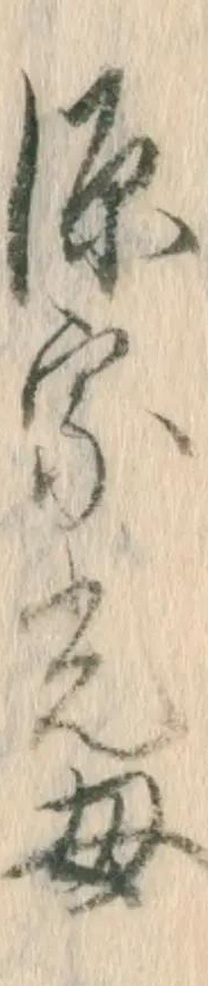源宗光母
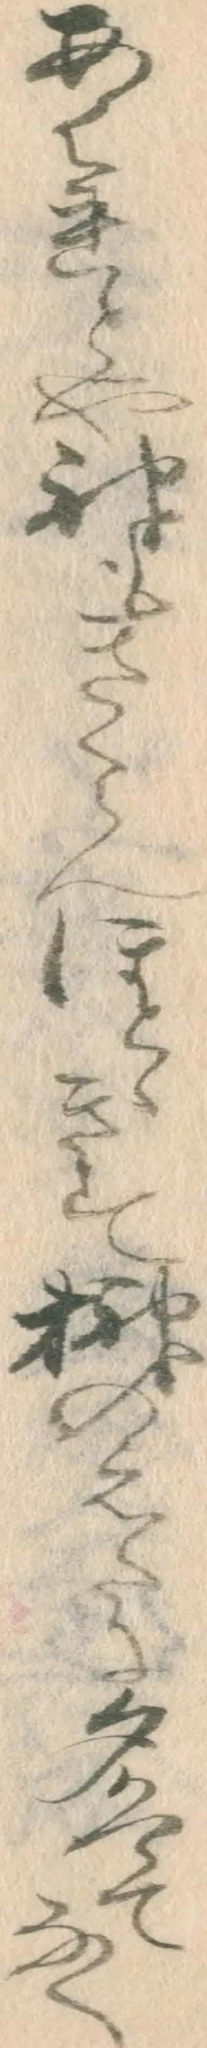あはれとや神もきくらんほとゝきす榊のえたに夕かけてなく
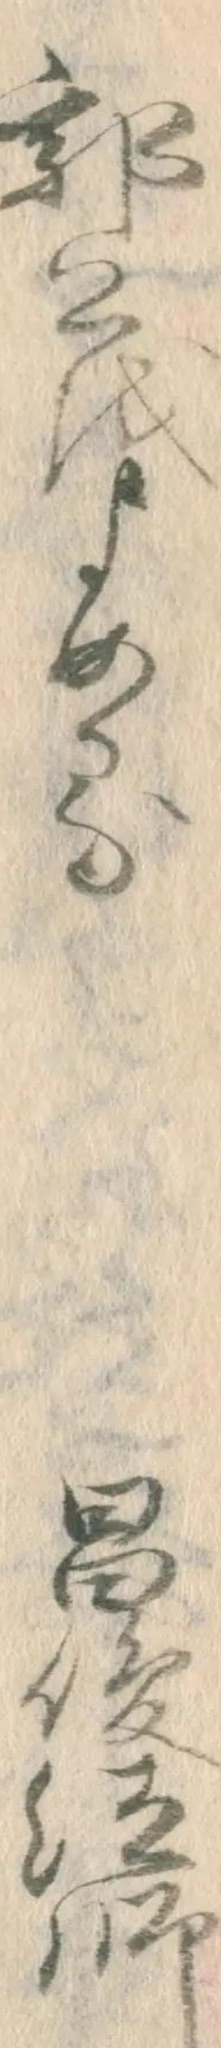郭公をよめる昌俊法師
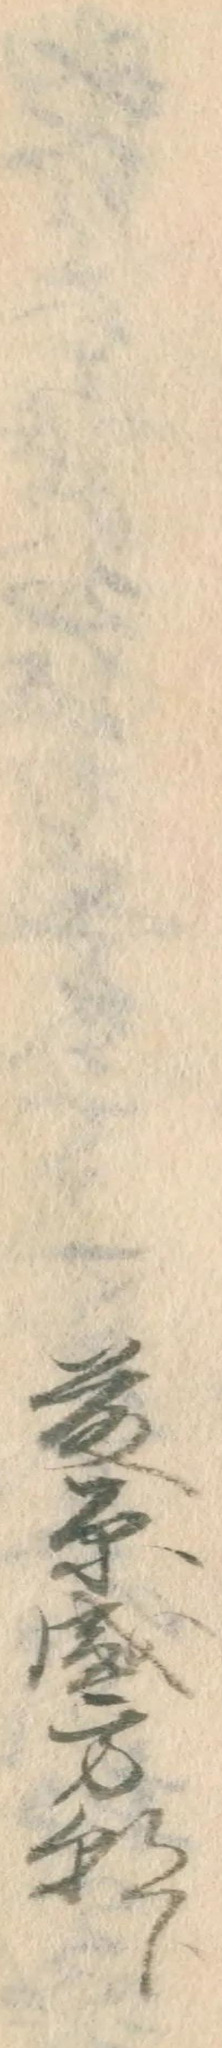藤原盛方朝臣
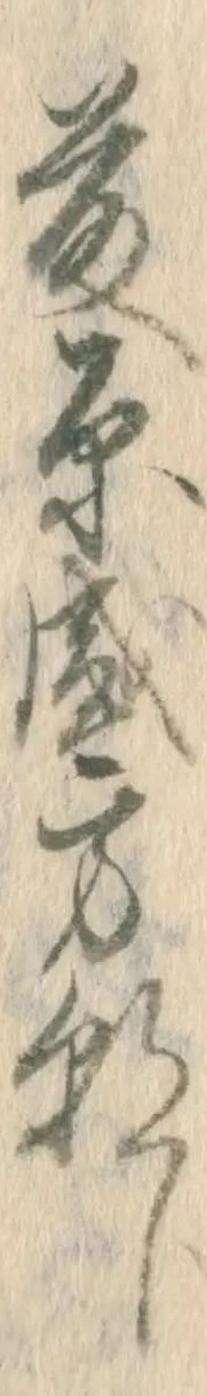藤原盛方朝臣
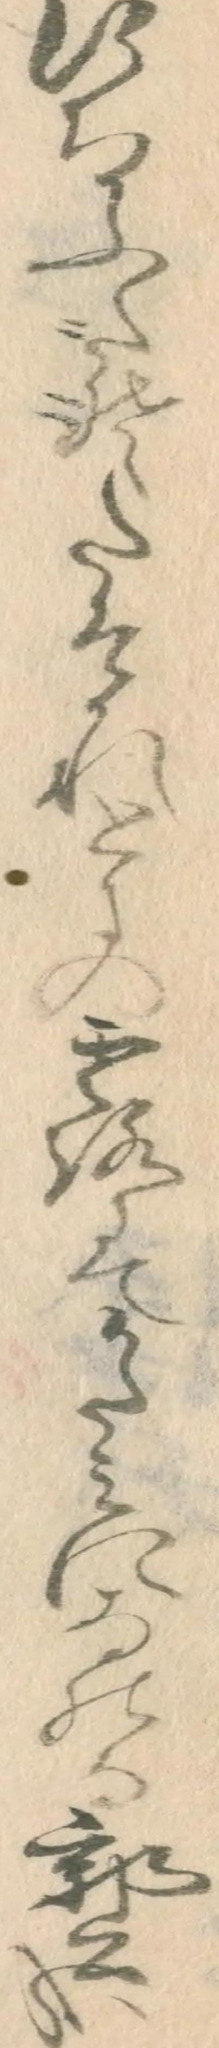行ちかふたそたそかれときの雲路にてかたみになのる郭公哉
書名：月詣和歌集
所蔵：国立国会図書館 National Diet Library, JAPAN
